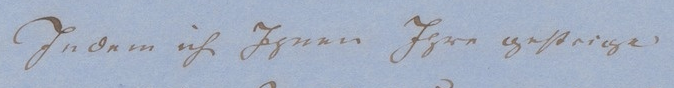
Indem ich Ihnen Ihre gestrige
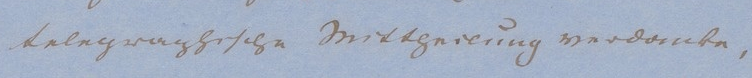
telegraphische Mittheilung verdanke,
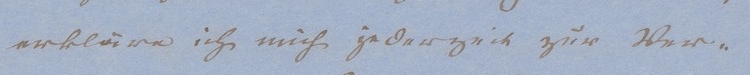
erkläre ich mich jederzeit zur Ver-
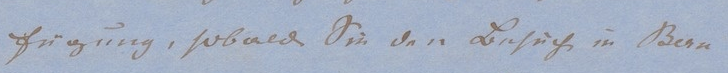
fügung, sobald Sie den Besuch in Bern
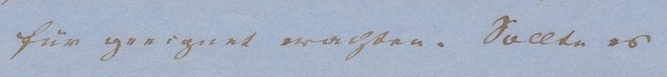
für geeignet erachten. Sollte es
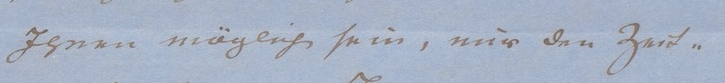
Ihnen möglich sein, mir den Zeit-
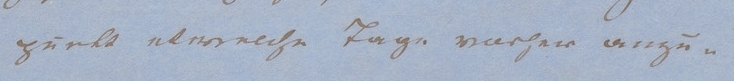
punkt etwelche Tage vorher anzu-
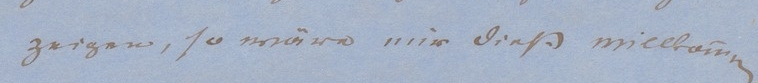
zeigen, so wäre mir dieß willkommen.
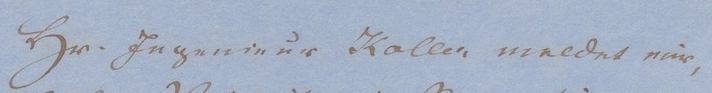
Hr. Ingenieur Koller meldet mir,
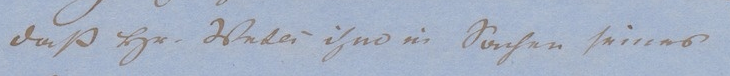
daß Hr. Wetli ihm in Sachen seines
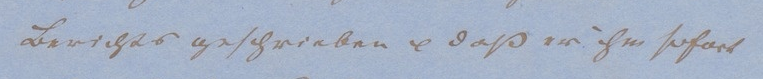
Berichts geschrieben & daß er ihm sofort
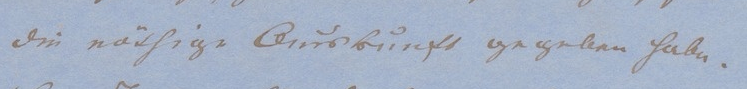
die nöthige Auskunft gegeben habe.
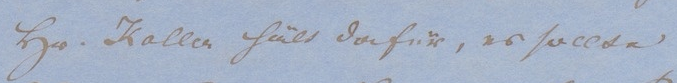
Hr. Koller hält dafür, es sollte
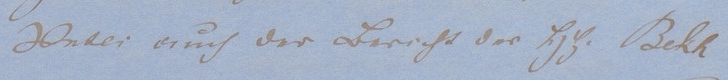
Wetli auch der Bericht der HH. Bekh
